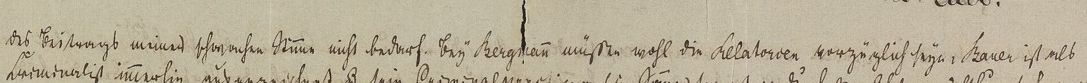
des Beitrags meiner schwachen Stimme nicht bedarf. Bey Bergmann müßen wohl die Relatorien vorzüglich seyn, Bauer ist als
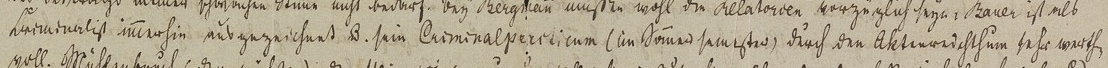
Criminalist immerhin ausgezeichnet u. sein Criminalpracticum (im Sommersemester) durch den Aktenreichthum sehr werth-
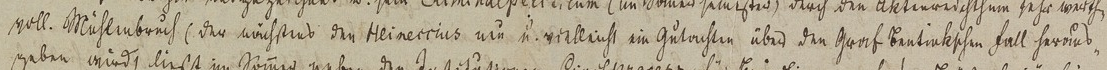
voll. Mühlenbruch (der nächstens den Heineccius neu u. vielleicht ein Gutachten über den Graf Bentinkschen Fall heraus-
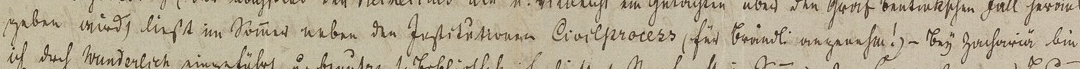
geben wird) liest im Sommer neben den Institutionen Civilprocess (für Brändli angenehm!) – Bey Zachariä bin
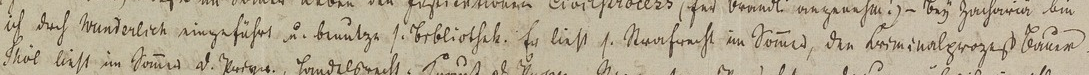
ich drch Wunderlich eingeführt u. benutze s. Bibliothek. Er liest s. Strafrecht im Sommer, den Criminalprozeß Bauer –
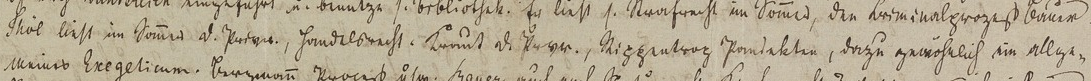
Thöl liest im Sommer d. Privr., Handelsrecht, Kraut d. Privr., Rippentrop Pandekten, dazu gewöhnlich ein allge-
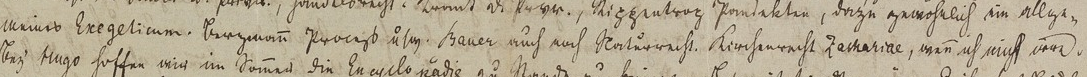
meines Exegeticum. Bergmann Proceß usw. Bauer auch noch Naturrecht. Kirchenrecht Zachariae, wenn ich nicht irre.
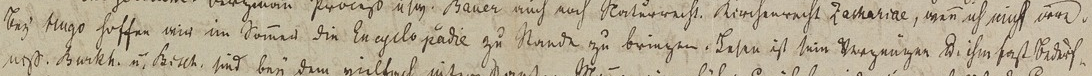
Bey Hugo hoffen wir im Sommer die Encyclopädie zu Stande zu bringen. Lesen ist sein Vergnügen u. ihm fast Bedürf-
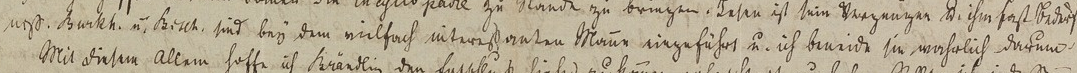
niß. Burkh. u. Bisch. sind bey dem vielfach interessanten Manne eingeführt u. ich beneide sie wahrlich darum.
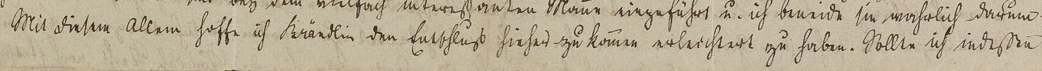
Mit diesem Allem hoffe ich Brändlin den Entschluß hieher zu kommen erleichtert zu haben. Sollte ich indessen
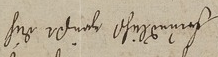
selbst darauf falle, gerne
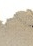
N. 52.
